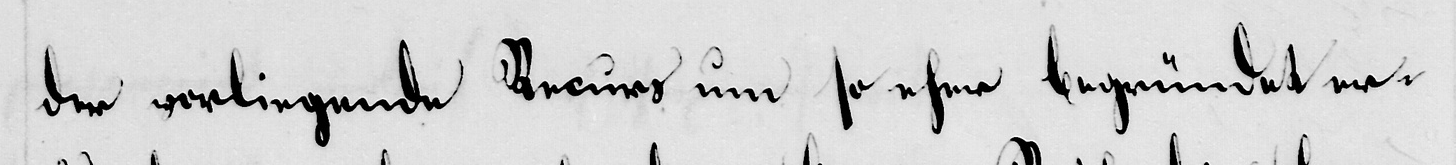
der vorliegende Recurs um so eher begründet er¬
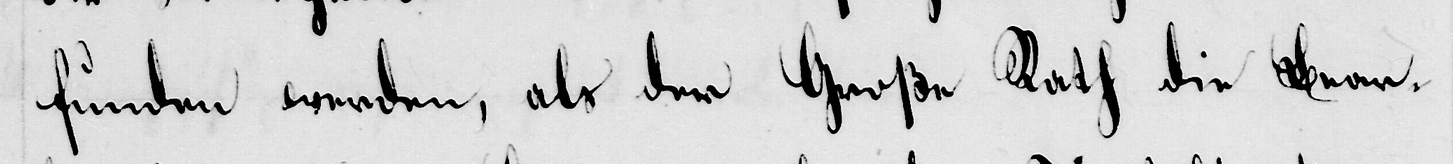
funden werden, als der Große Rath die Bear¬
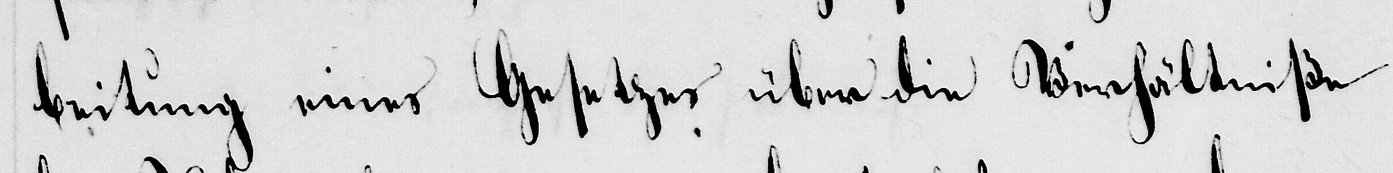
beitung eines Gesetzes über die Verhältniße
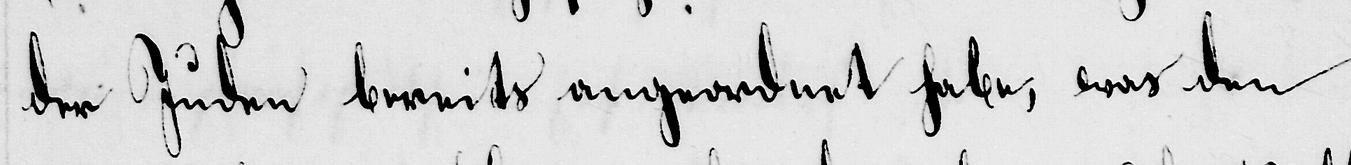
der Juden bereits angeordnet habe, was den
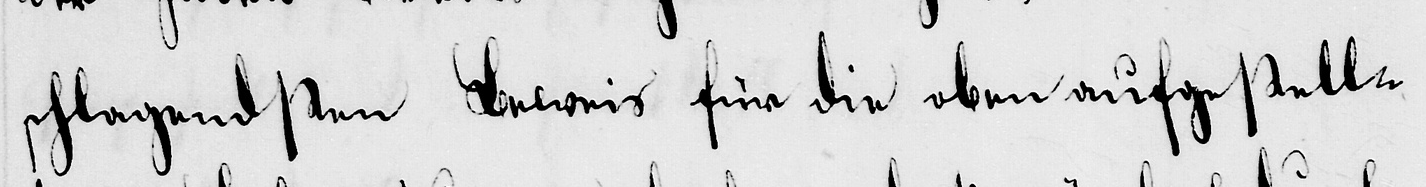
schlagendsten Beweis für die oben aufgestell¬
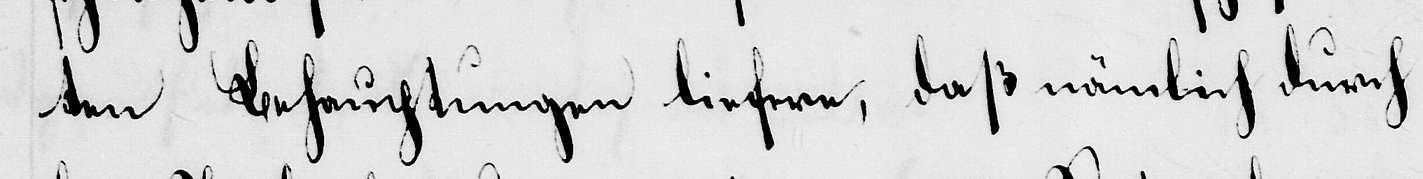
ten Behauptungen liefere, daß nämlich durch
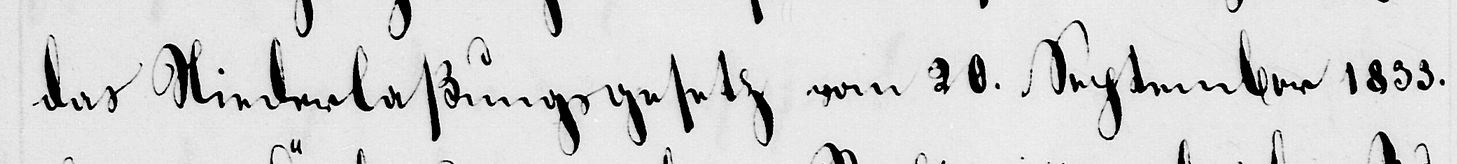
das Niederlaßungsgesetz vom 20. September 1833.
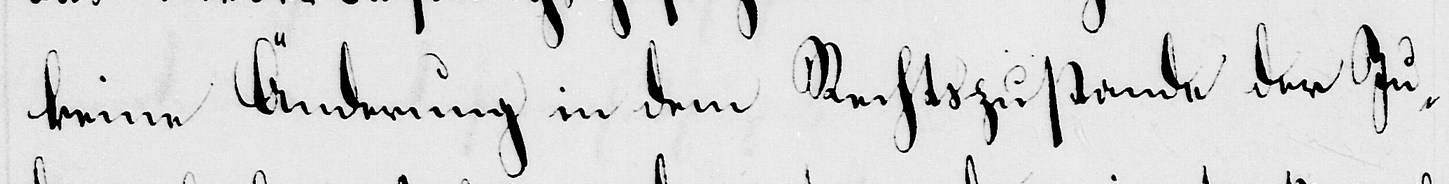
keine Änderung in dem Rechtszustande der Ju¬
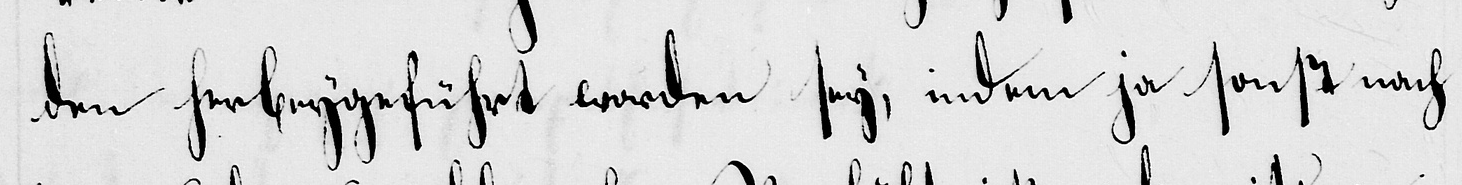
den herbeygeführt worden sey, indem ja sonst nach
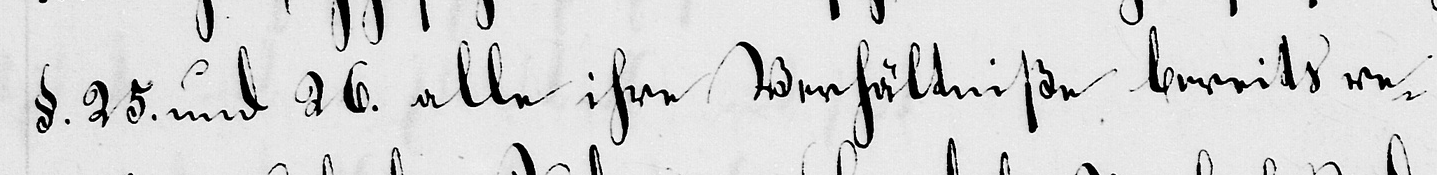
§. 25. und 26. alle ihre Verhältniße bereits re¬
